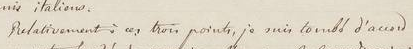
Relativement à ces trois points, je suis tombé d'accord
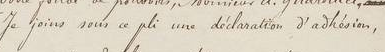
Je joins sous ce pli une déclaration d'adhésion,
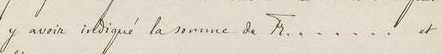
y avoir indiqué la somme de Fr...... et
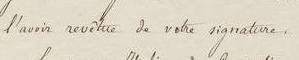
l'avoir revêtue de votre signature.
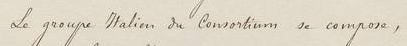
Le groupe Italien du Consortium se compose,
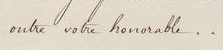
outre votre honorable....
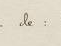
de:
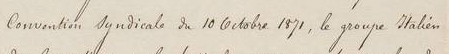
Convention Syndicale du 10 Octobre 1871, le groupe Italien
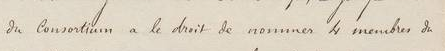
du Consortium a le droit de nommer 4 membres du
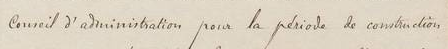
Conseil d'administration pour la période de construction
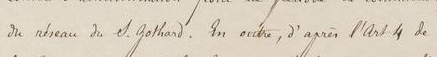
du réseau du S. Gothard. En outre, d'après l'Art 4 de
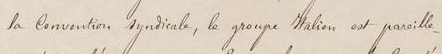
la Convention syndicale, le groupe Italien est pareille-
